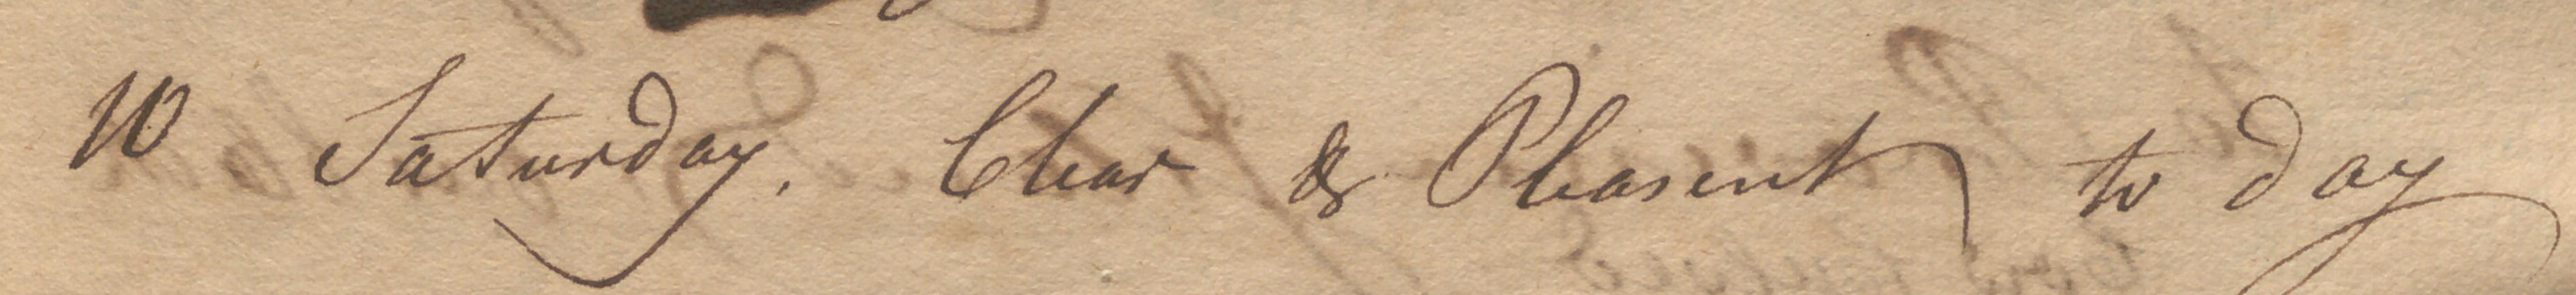10 Saturday. Clear & Pleasent to day
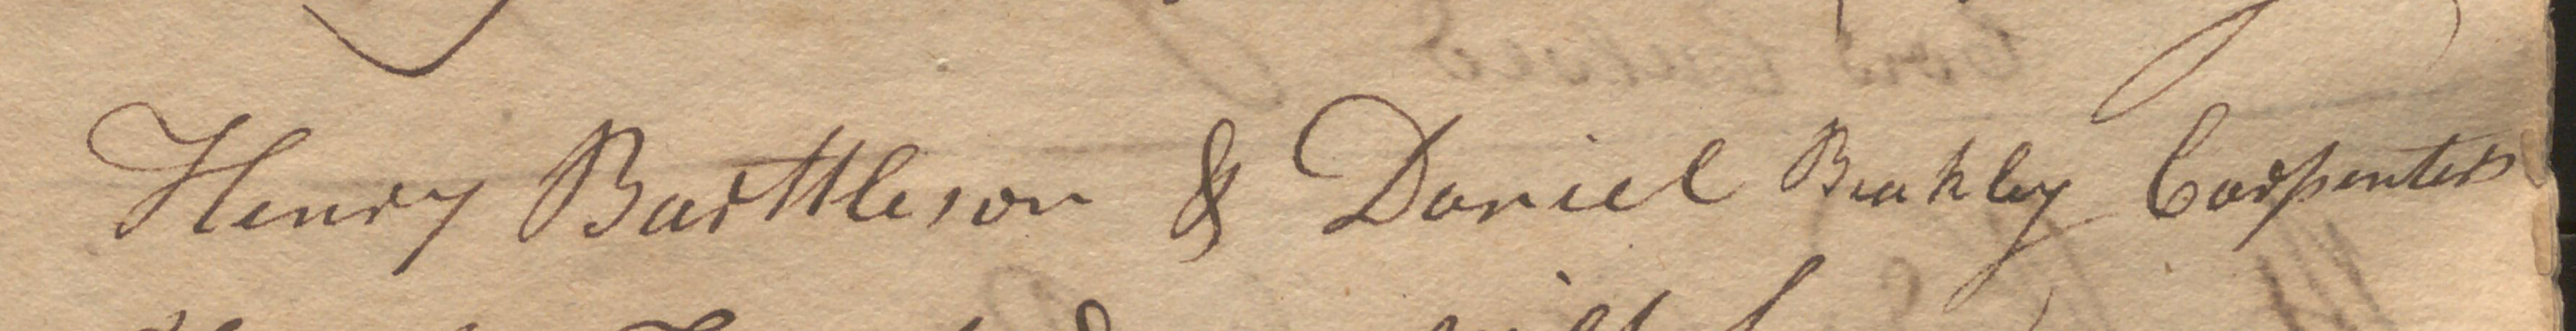Henry Barttleson & Daniel Buckley Carpenters
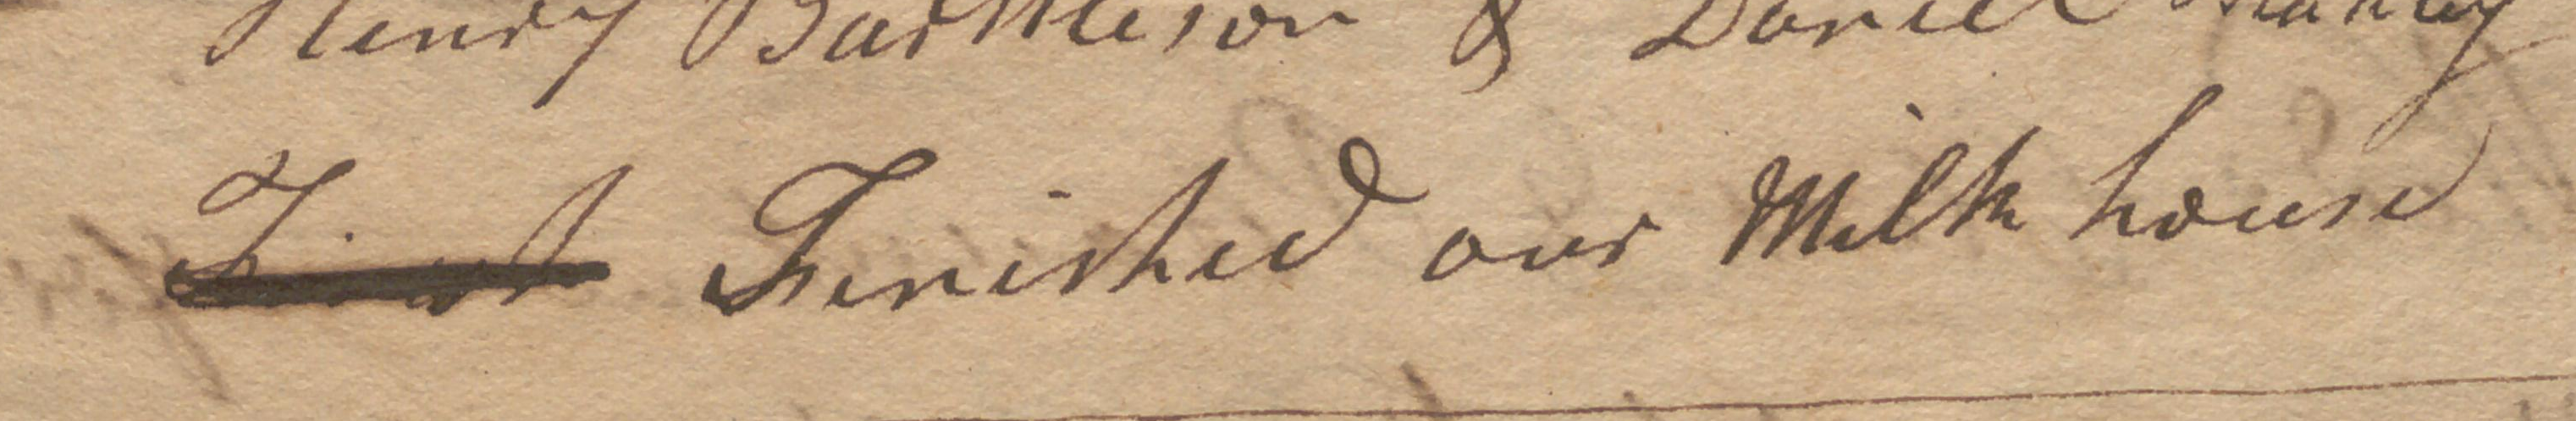[______] Finished our Milk house
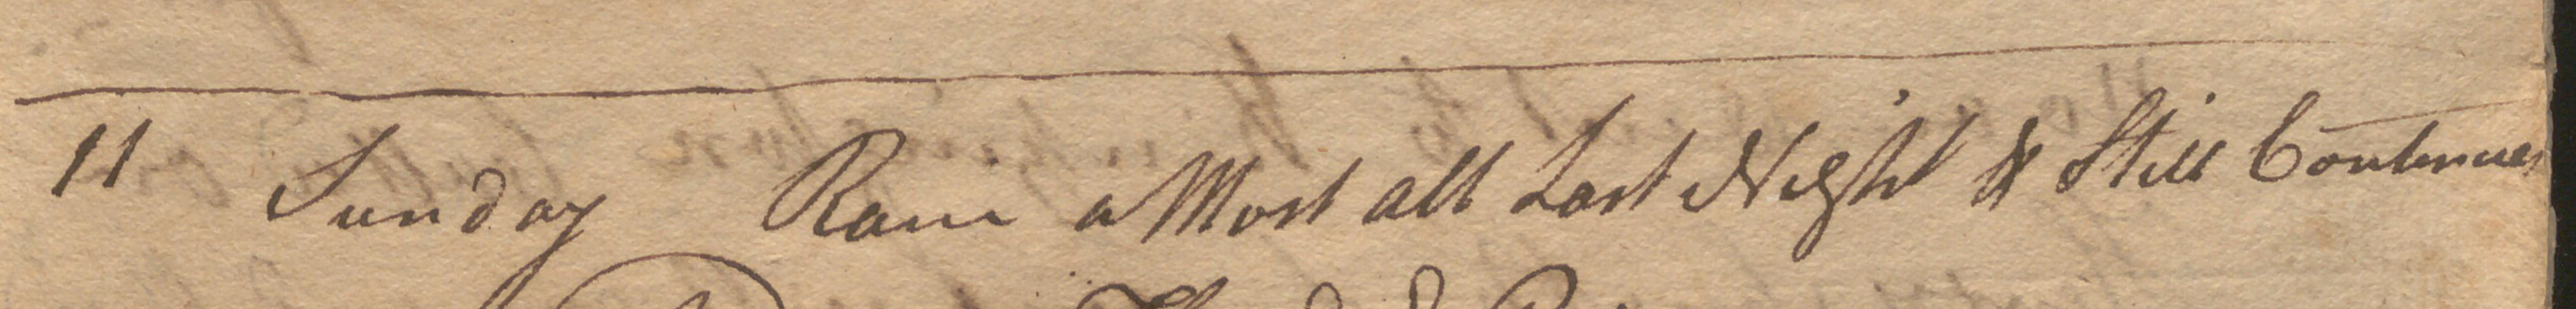11 Sunday Rain a Most all Last Night & Still Continue
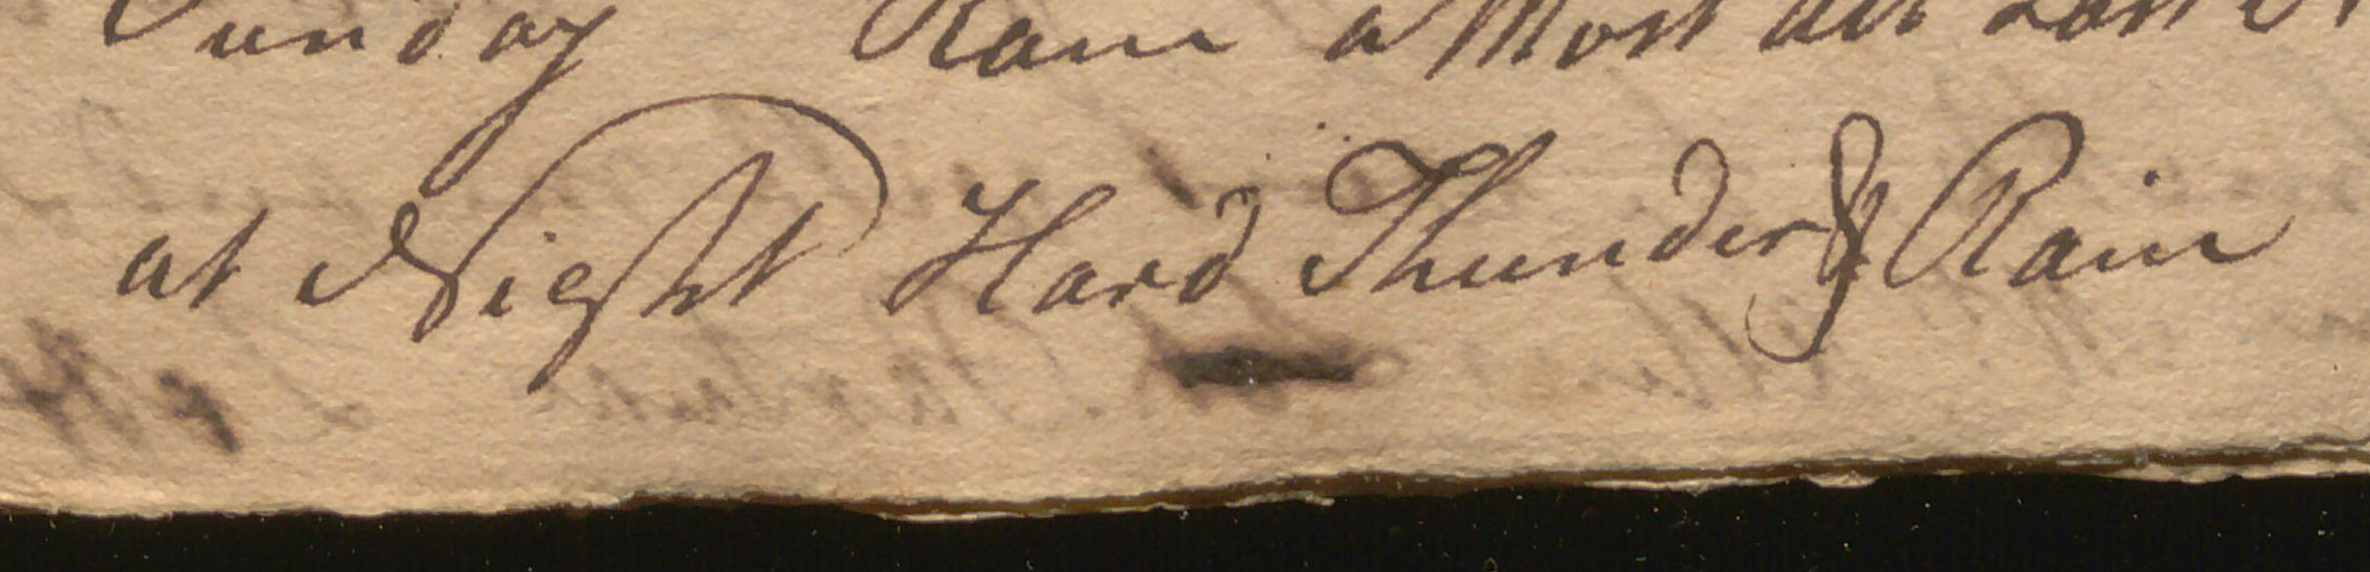at Night Hard Thunder & Rain
